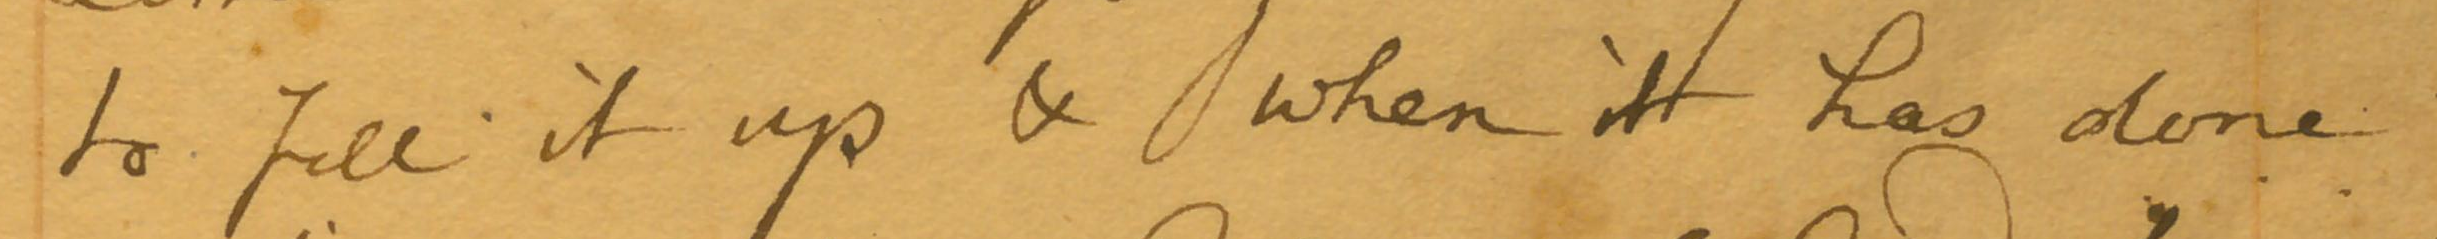to fill it up & when it has done
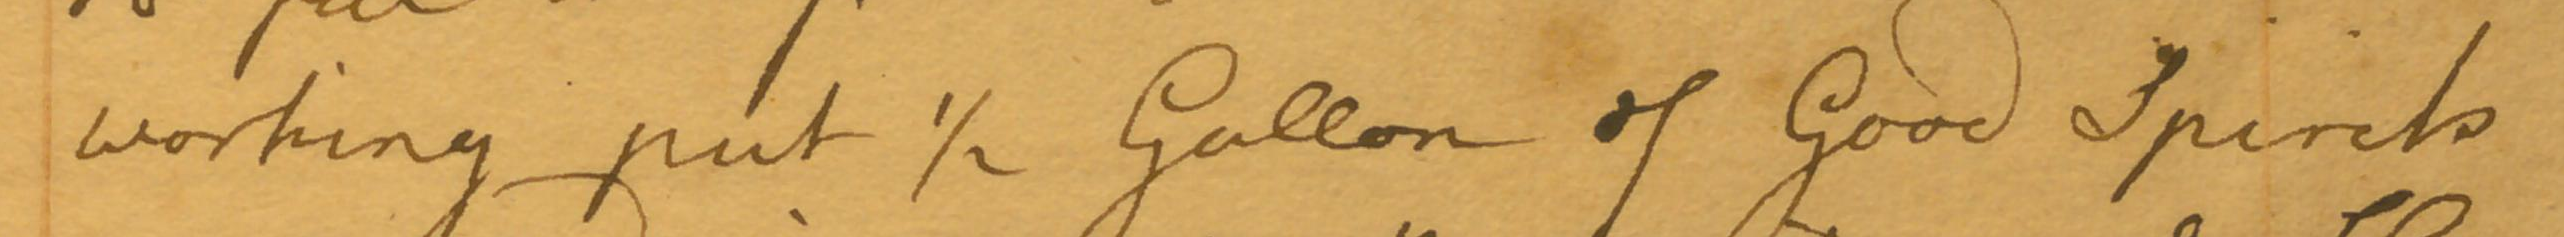working put 1/2 Gallon of Good Spirits
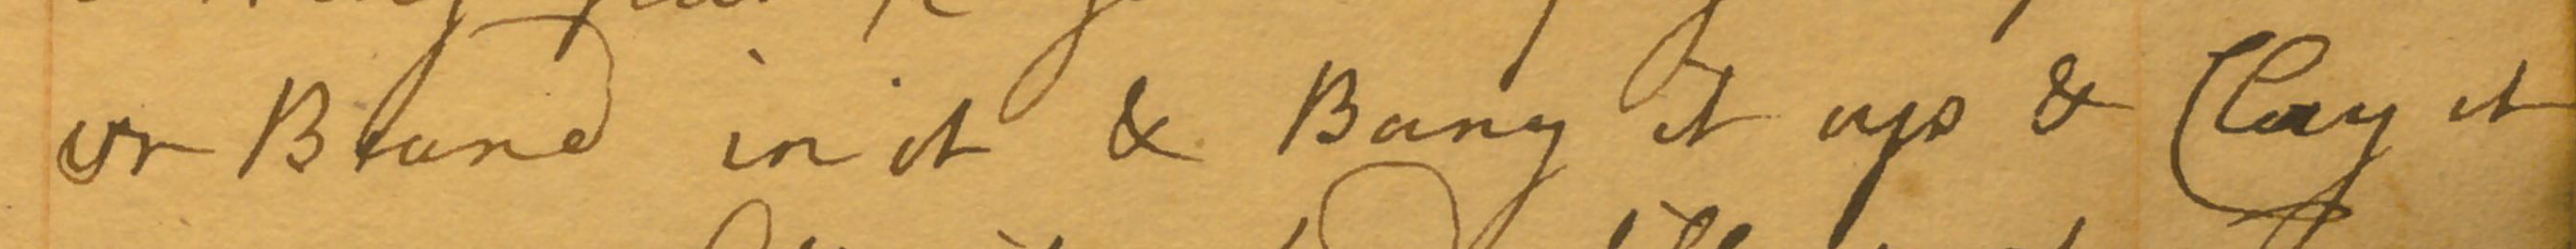or Bland in it & Bang it up & Clay it
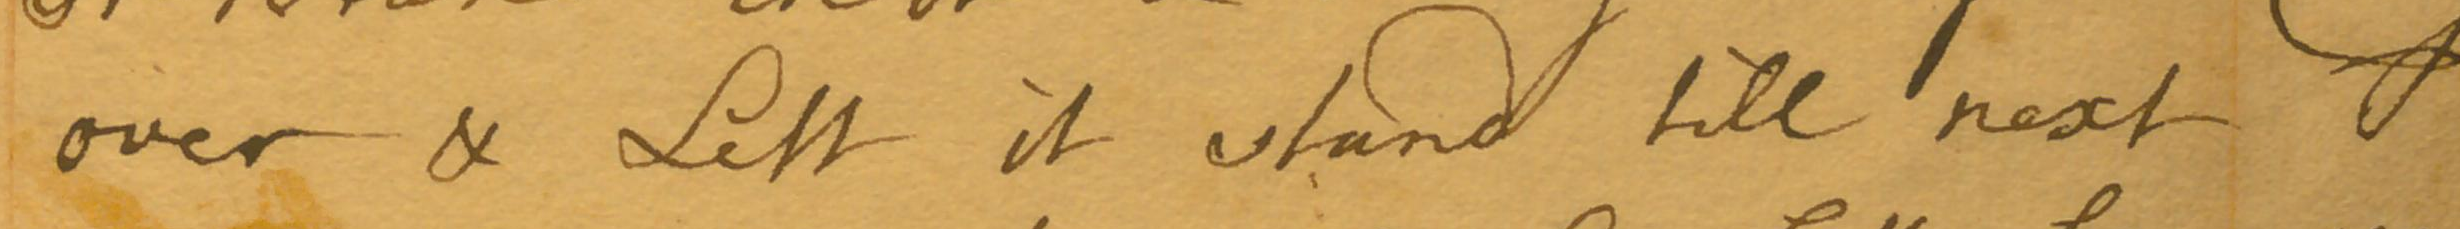over & Lett it stand till next
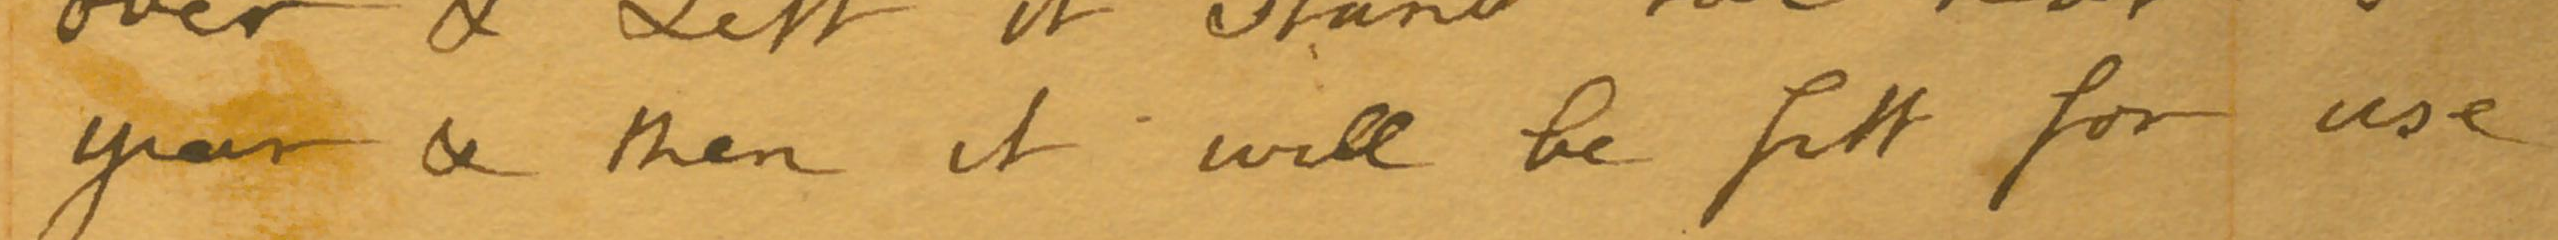year & then it will be sett for use
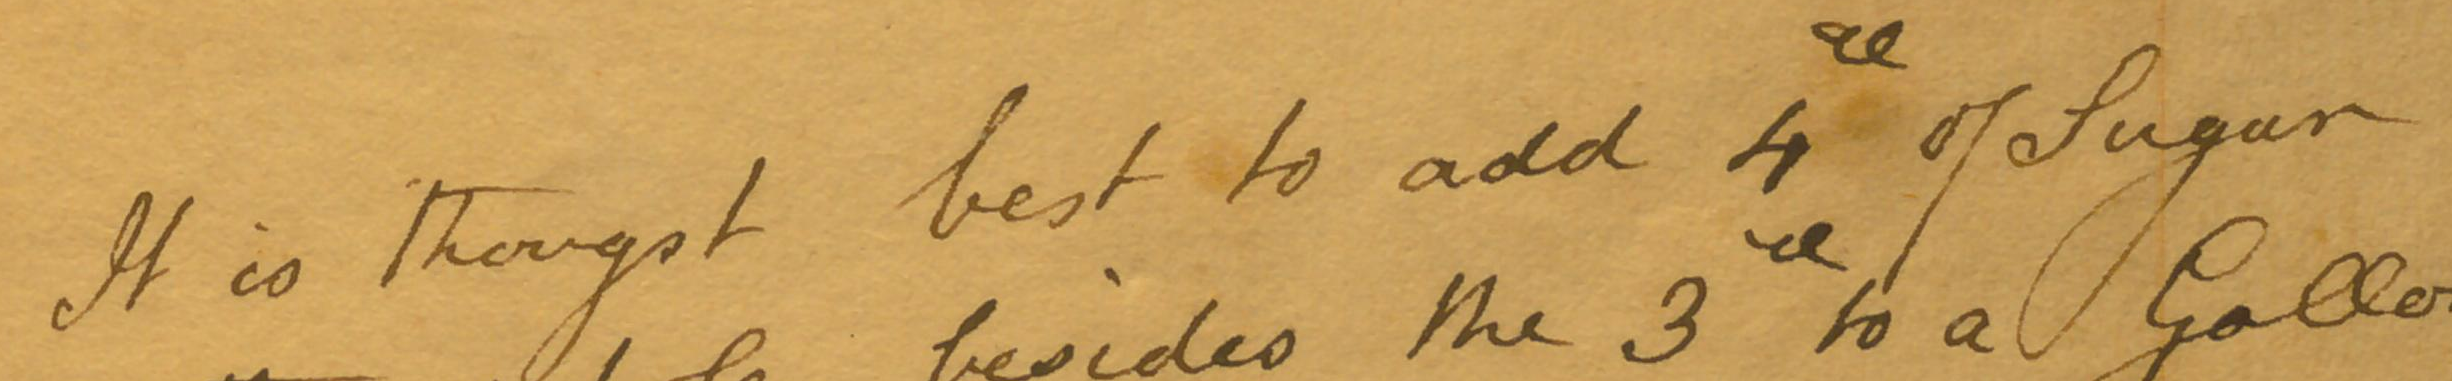It is thougst best to add 4 ^lb of Sugar
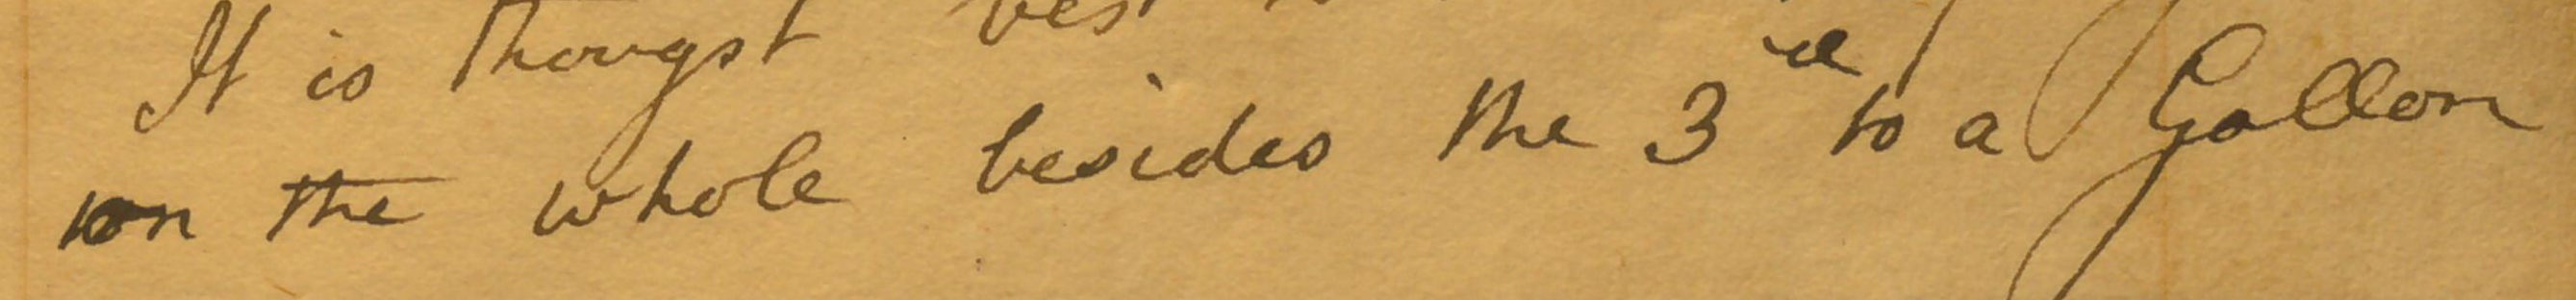on the whole besides the 3 ^lb to a Gallon
